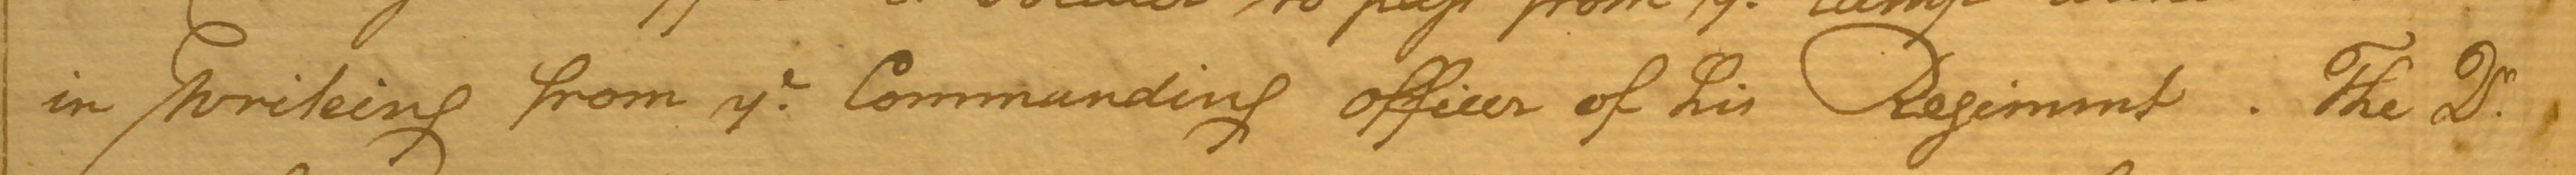in writing from y^e. Commanding officer of his Regiment. The Q^r.
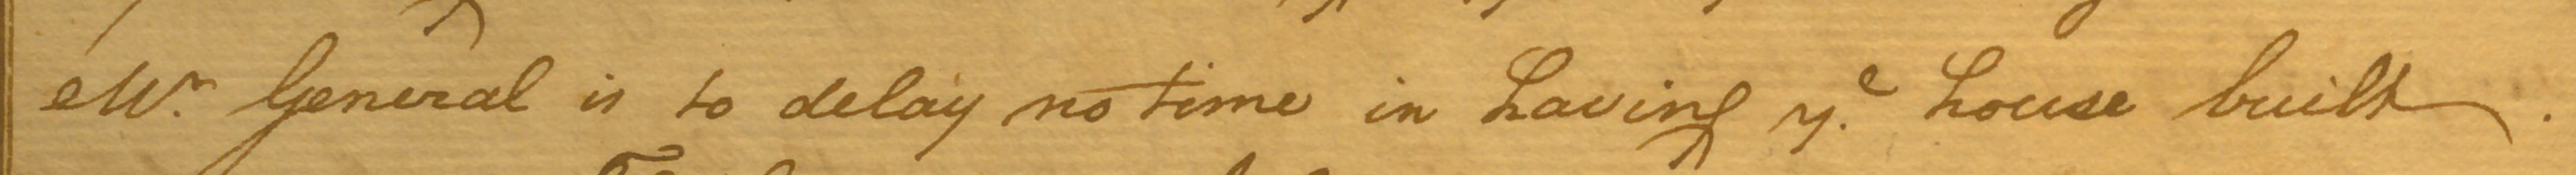M^r. General is to delay no time in having y^e. house built.
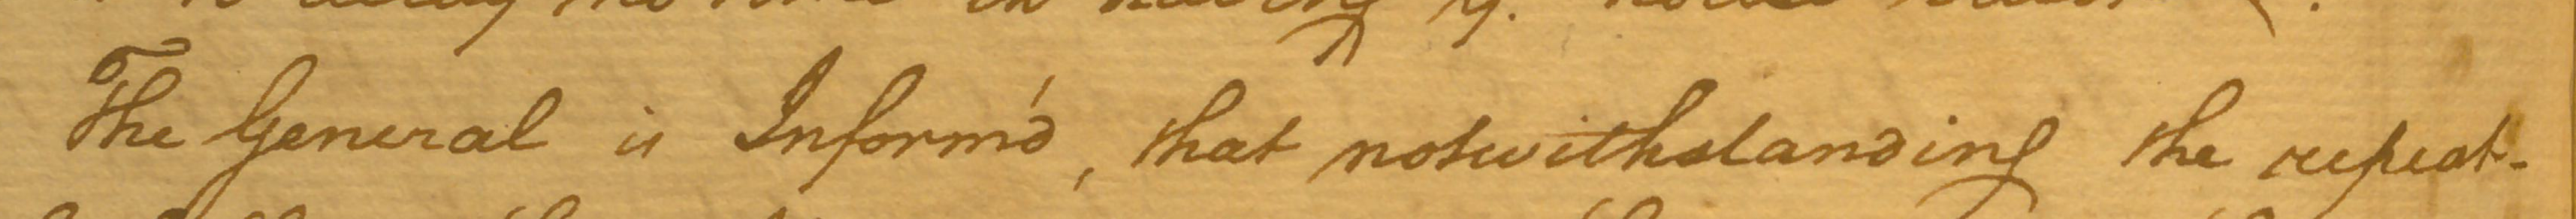The General is Inform'd, that notwithstanding the repeat-
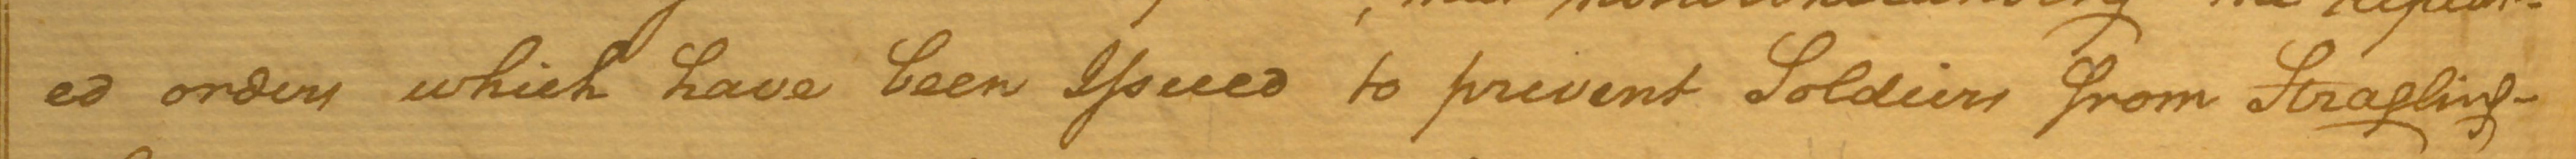ed orders which have been Issued to prevent Soldiers from Stragling-
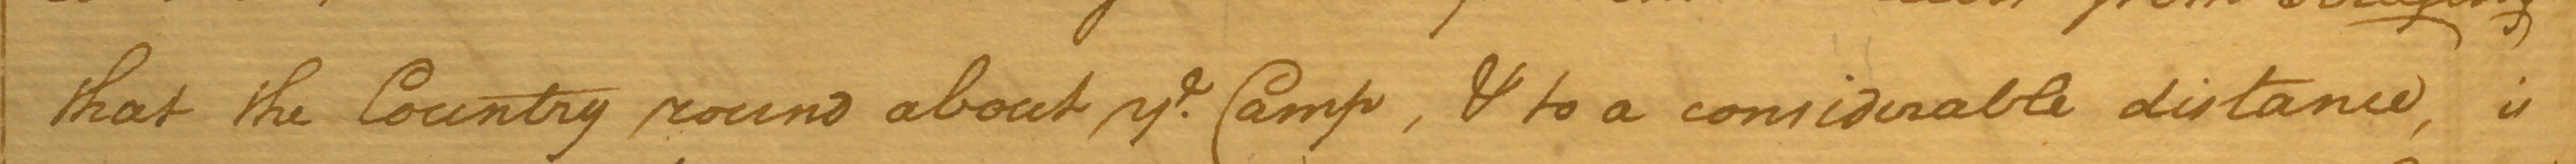that the Country round about y^e. Camp, & to a considerable distance, is
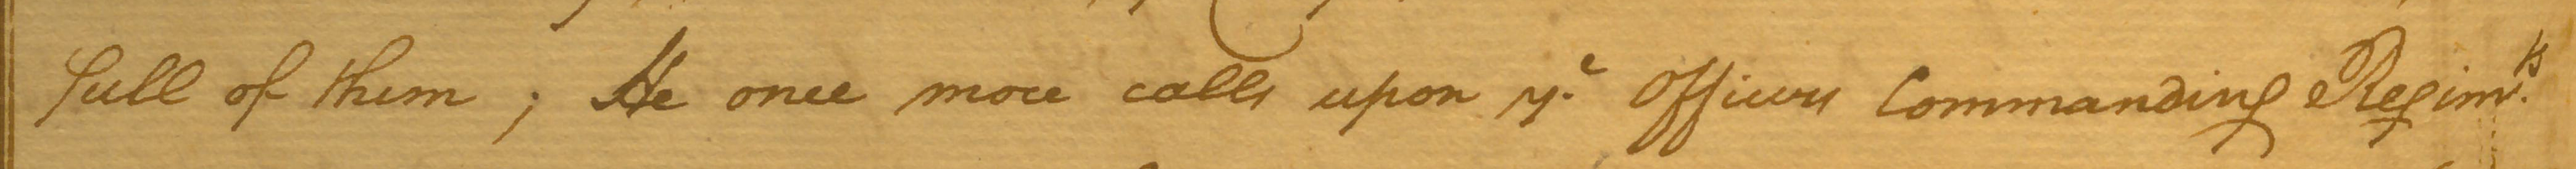full of them; He once more calls upon y^e. Officers Commanding Regim^ts.
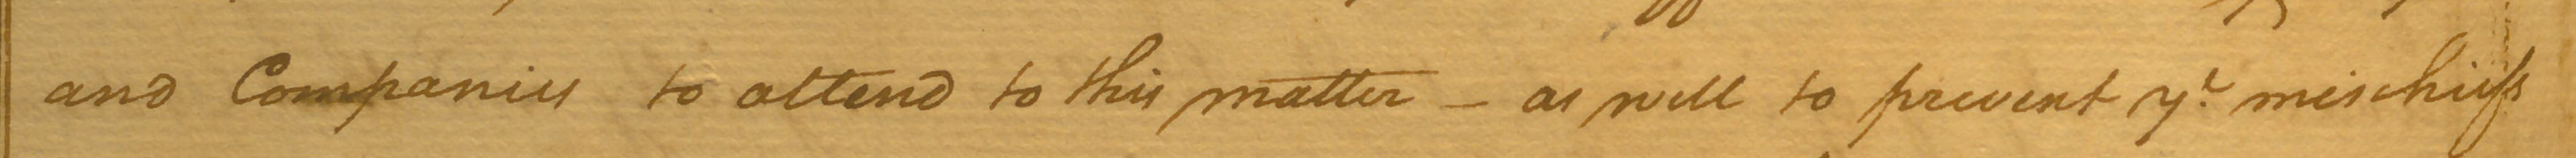and Companies to attend to this matter- as well to prevent y^e. mischiefs
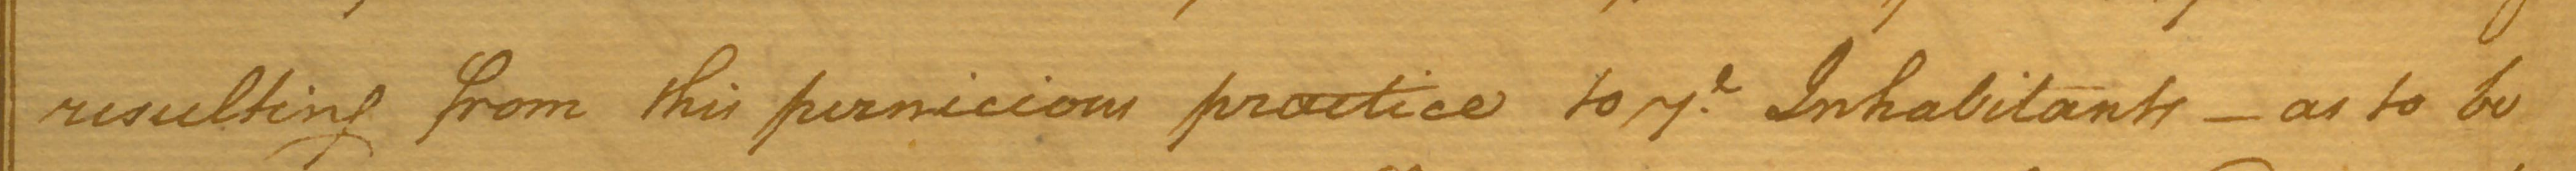resulting from this pernicious practice to y^e. Inhabitants- as to be
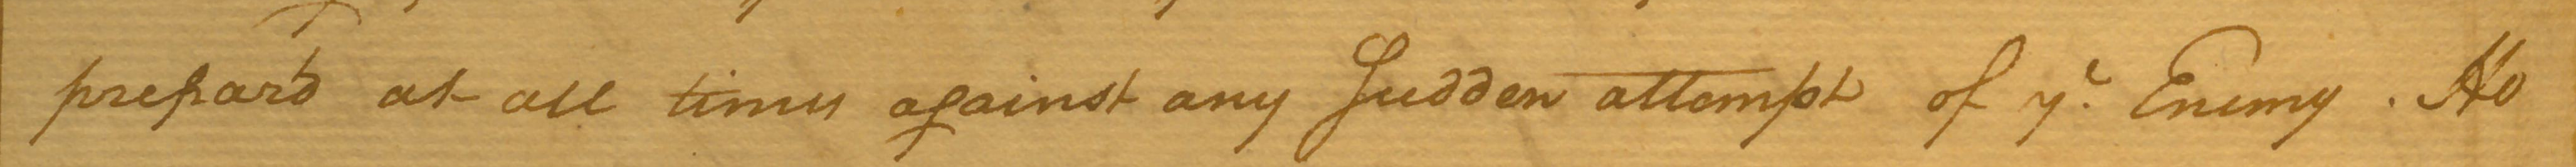prepar'd at all times against any sudden attempt of y^e. Enemy. He
